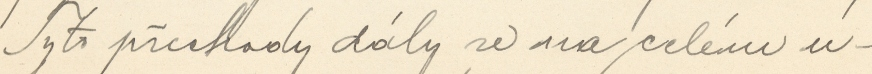Tyto přechody dály se na celém ú-
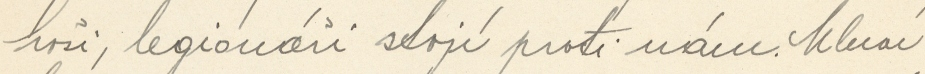hoši, legionáři stojí proti nám. Mluví
